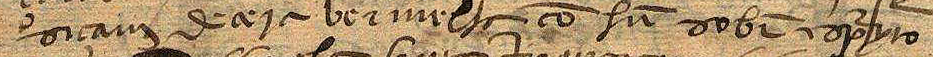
siçam de cera vermelha c̄o hū sobr̄ esp̄yto
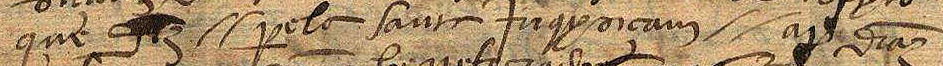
que diz // ꝑela santa Jnqysiçam // a ꝓo diaz
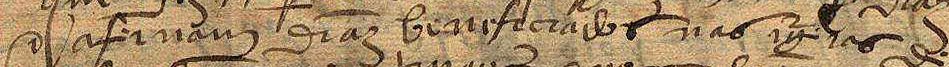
e a fernam diaz beneficiados nas iḡeias de
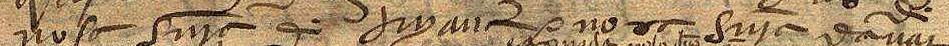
nosa Sn̄ra de tryana e nosa Snr̄a da uar
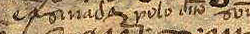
ea sinada polo dito sōr
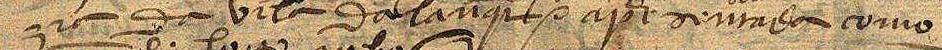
zia da vila dalanq̄r e ap̄esentada como
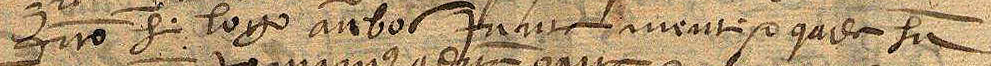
dito he logo anbos Juntamente e qada hū
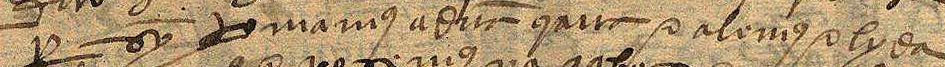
ꝑ sy tomamꝯ a dita qarta e a lemꝯ e lyda
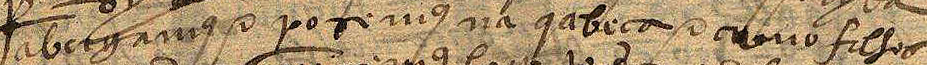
a beigamꝯ e posemꝯ na qabeça e como filhos
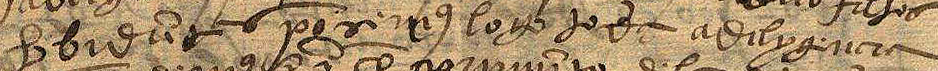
hobidiētes posemꝯ logo toda a dilygencia
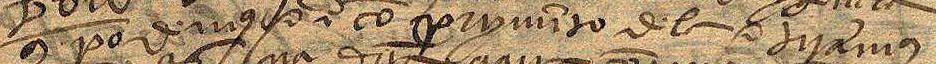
q̄ podemꝯ e ē cōprymēto dela e tiramꝯ
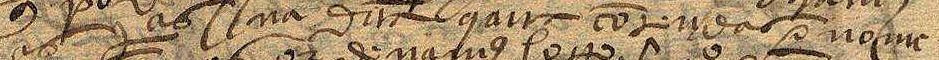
as tas na dita qarta cōteudas e nome
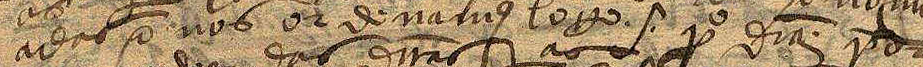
adas e nos ordenamꝯ logo .s. ꝓo diaz por
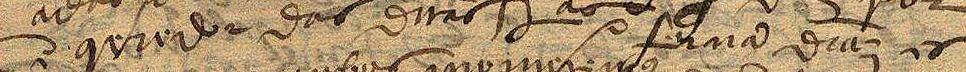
ēqeredor das ditas tas e fernā diaz es
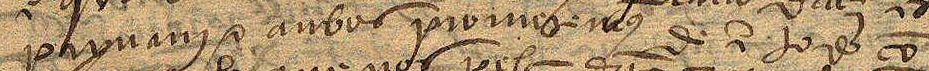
pryuam e anbos prometemꝯ de ē todo c̄o
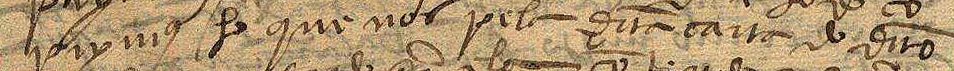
prymꝯ ho que nos pela dita carta do dito
